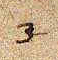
3
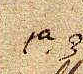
ta. 3
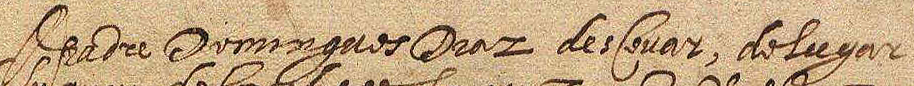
O padre Dominguos Diaz desCouar, do Lugar
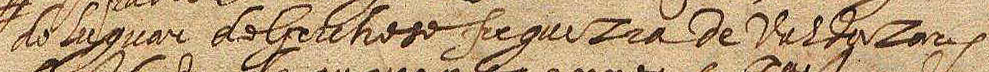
do Luguar do Grichoso freguezia de Valdazares
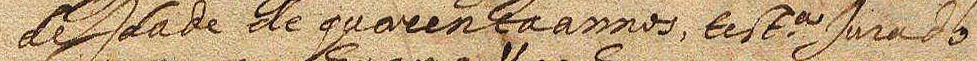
de Jdade de quarenta annos, test.a Jurado
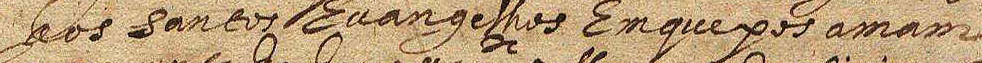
aos santos Euangelhos Em que pos a mam
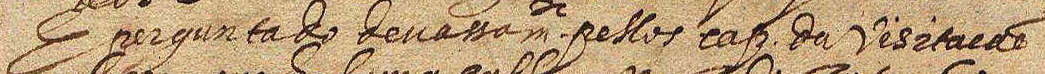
E perguntado deuassamte pellos cap. da Visitaçaõ
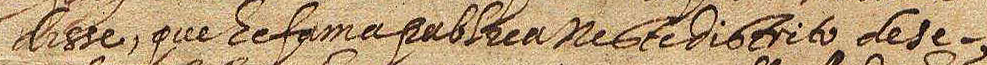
disse, que he fama publica neste distrito de se
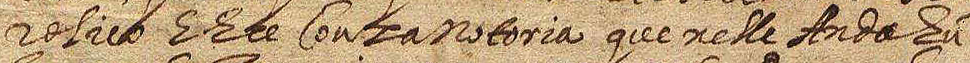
rolico E hee Couza notoria que nelle Anda hū
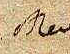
o Reo
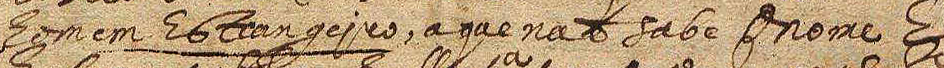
homem Estrangejro, a que naõ sabe O nome E
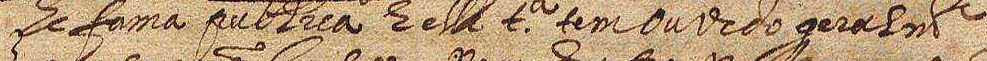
he fama publica E elle t.a tem ouvido geralmte
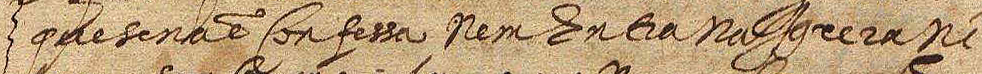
que se naõ Confessa nem Entra na Jgreia nē
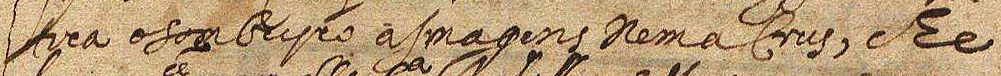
tira o sombrejro a Jmagens nem a Crus, e he
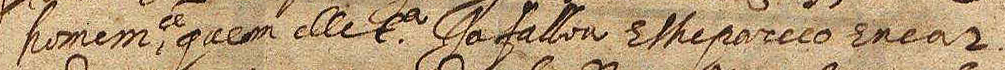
homem, cō quem elle t.a Ja fallou E lhe pareco Encar
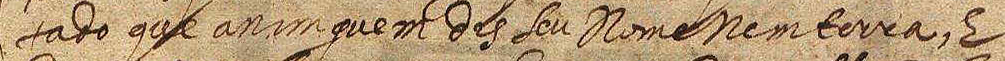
tado que a nimguem dis seu nome nem terra, E
